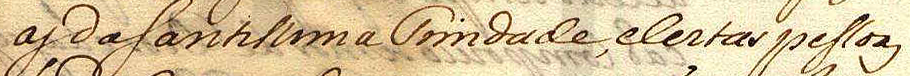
as da santissima Trindade, e certas pessoas
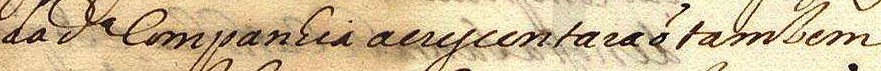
da da companhia acrescentaraõ tambem
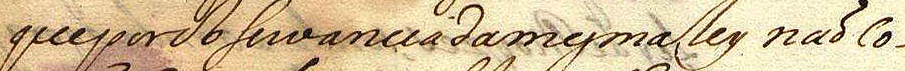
que por observancia da mesma ley naõ co
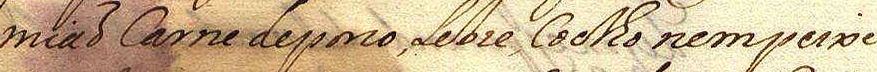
miaõ carne de porco, Lebre, coelho nem peixe
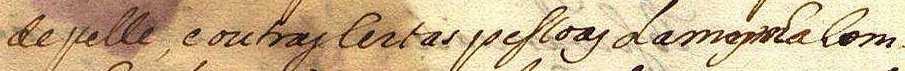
de pelle, e outras certas pessoas da mesmha com
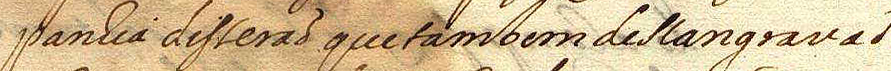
panhia disseraõ que tambem dessangravaõ
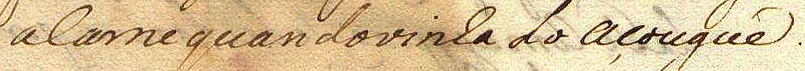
a carne quando vinha do açougue.
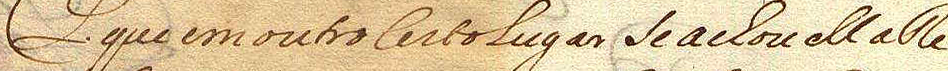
P. que em outro Certo Lugar se achou ella Re
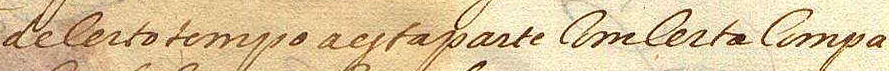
de certo tempo a esta parte com certa compa
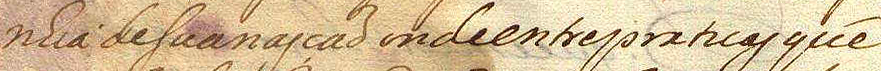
nhia de sua nasçaõ onde entre praticas que
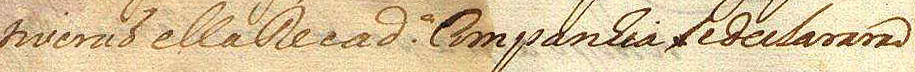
tiveraõ ella Re e a d.a companhia se declararaõ
